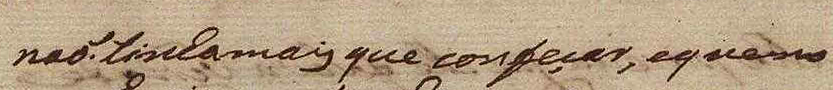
naõ tinha mais que confeçar, e que no
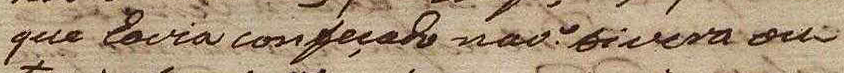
que havia confeçado naõ tivera ou
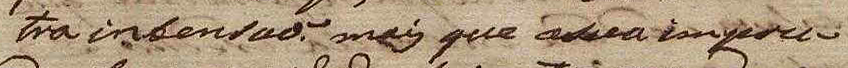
tra intensaõ mais que a sua impru
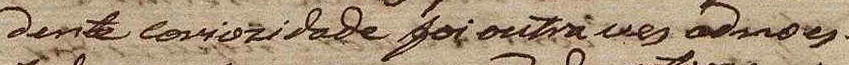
dente coriozidade foi outra ves admoes
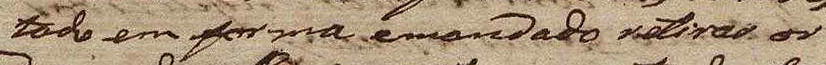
tado em forma e mandado retirar or
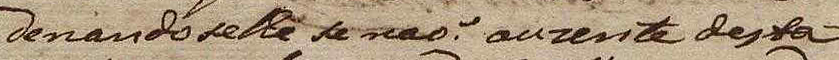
denando se lhe se naõ auzente desta
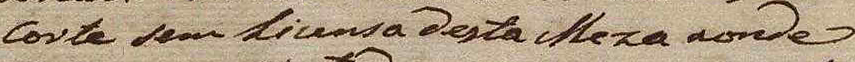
corte sem Licensa desta Meza aonde
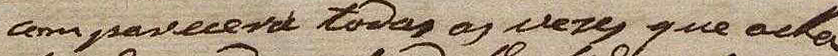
comparecerá todas as vezes que a ella
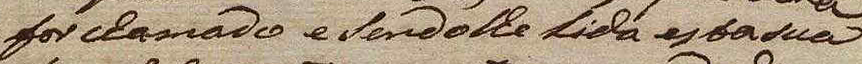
for chamado e sendo lhe Lida esta sua
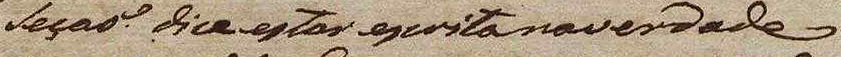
seçaõ dice estar escrita na verdade
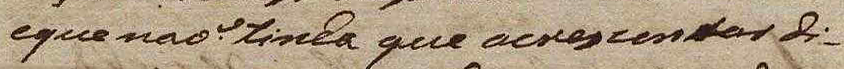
e que naõ tinha que acrescentar di
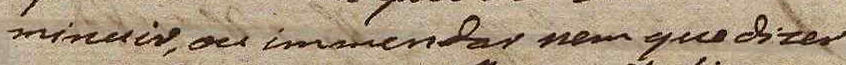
minuir, ou immendar, nem que dizer
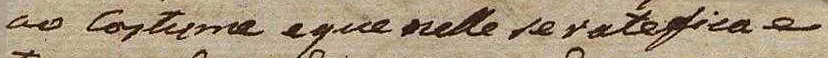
ao costume e que nelle se ratefica e
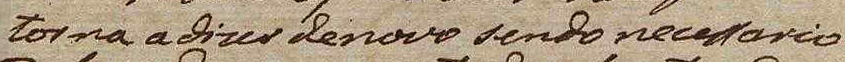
torna a dizer de novo sendo necessario
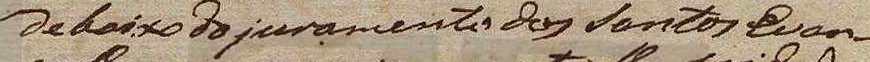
debaixo do juramento dos Santos Evan
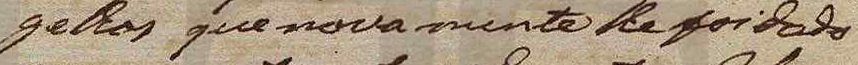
gelhos que novamente lhe foi dado
